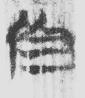於
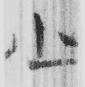少
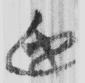臣
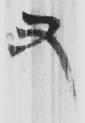又
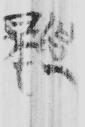{日虫頁}
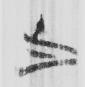之
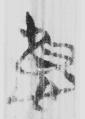惪
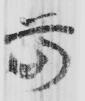可
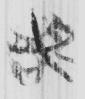若
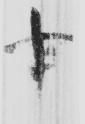才
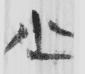少
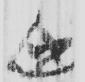臣
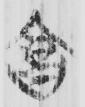合
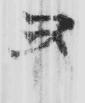又
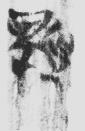{日虫頁}
